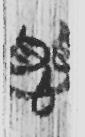愳
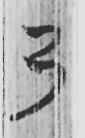乃
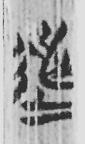逃
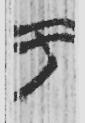于
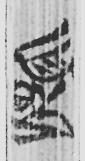{日止頁}（夏）
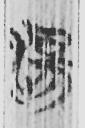湯
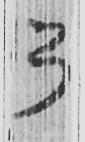乃
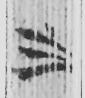之
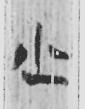少
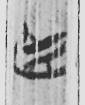臣
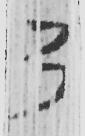乃
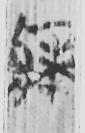{疒未}
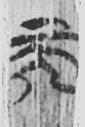而
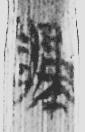{爿帚}（寢）
